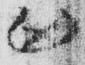凶
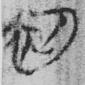初
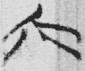六
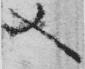又（有）
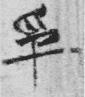孚
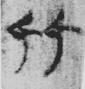比
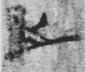之
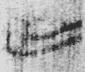亡（无）
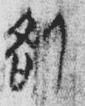咎
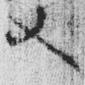又（有）
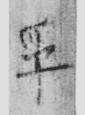孕
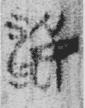海
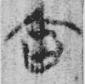缶
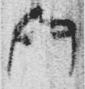夂（終）
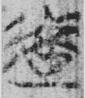逨（來）
